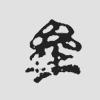墨
